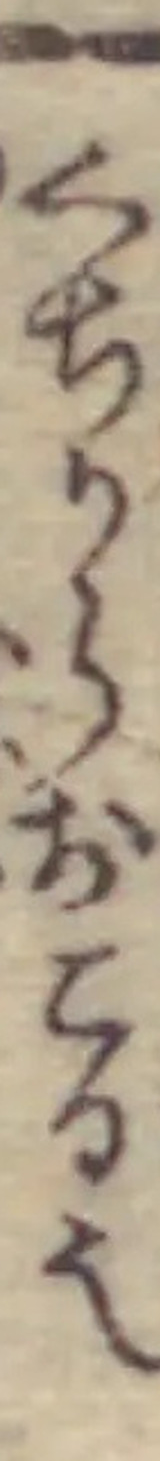くちからおこる也
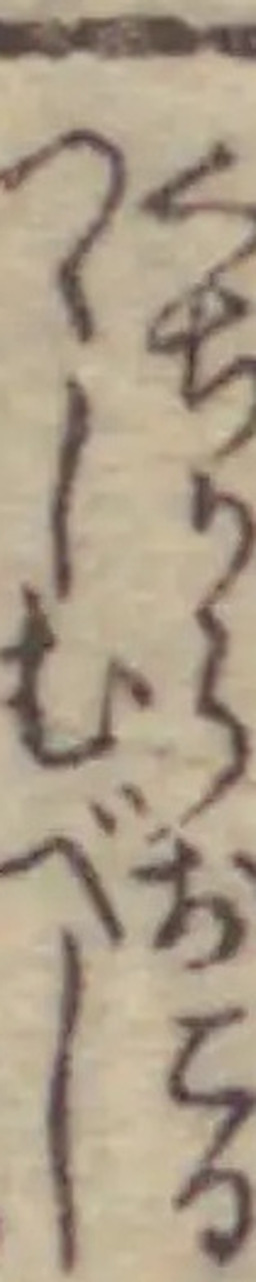つゝしむべし
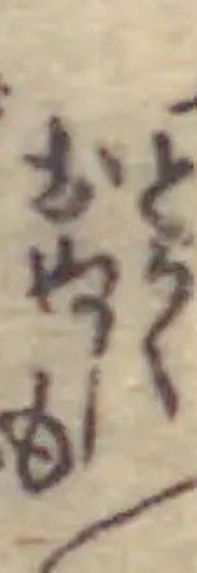おぬしも
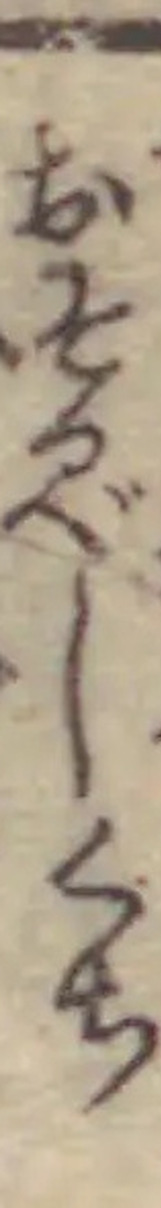おそるべしくち
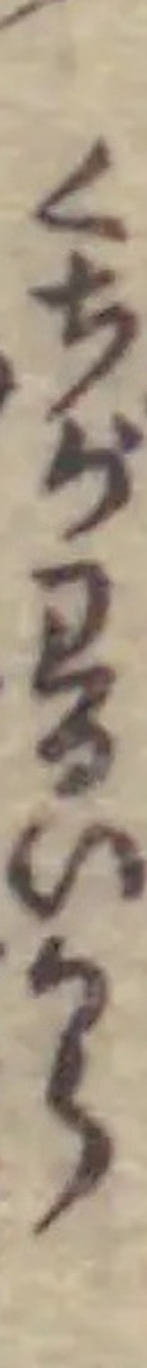くちがわるいから
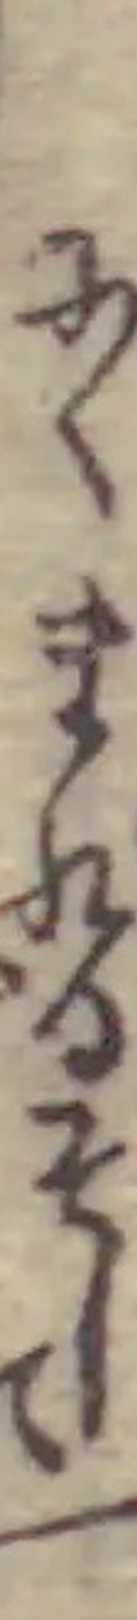にくまれるそして
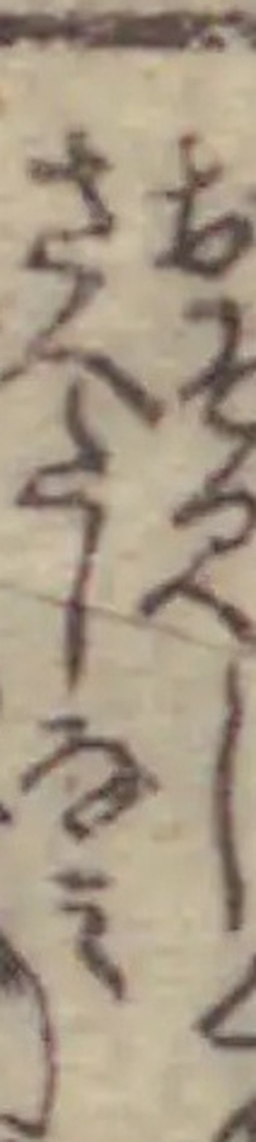さへたしなみ
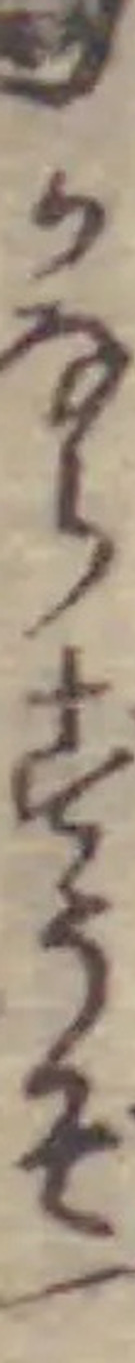かならずうそ
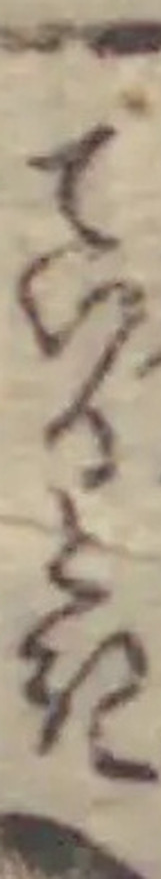ているとき
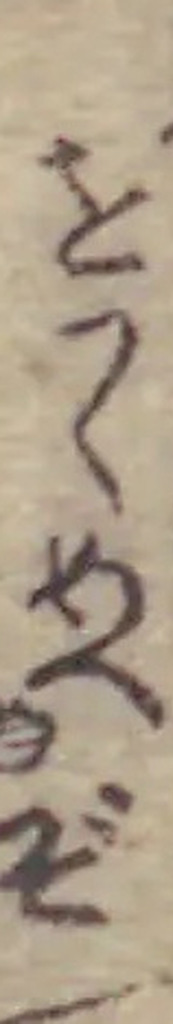をつくめへぞ
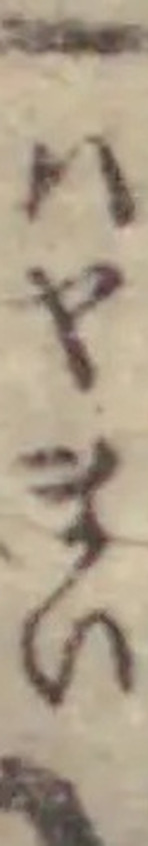はやまい
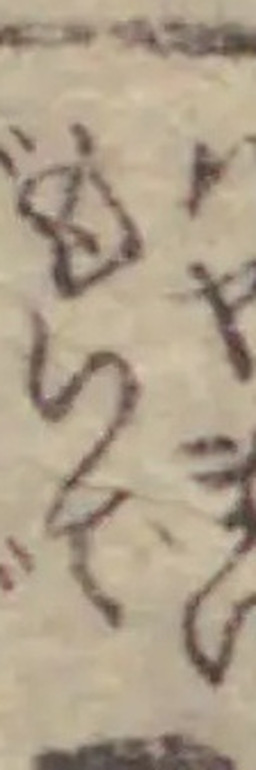もいで
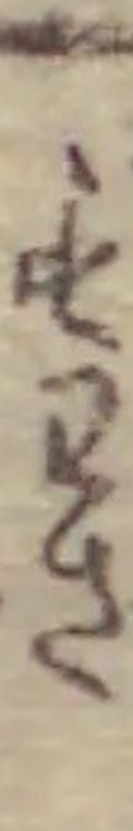ずわざ
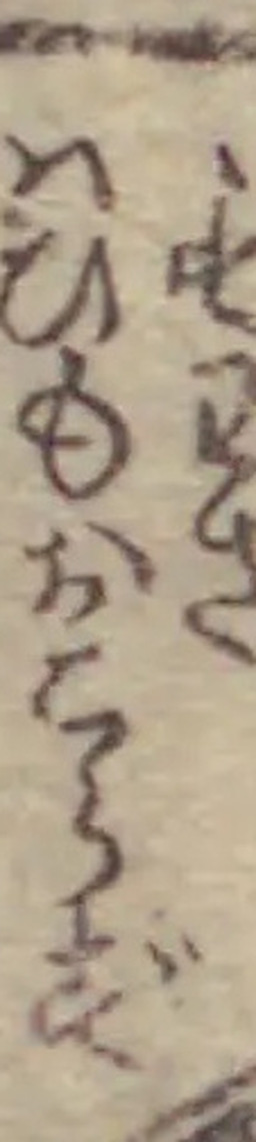はひもおこらず
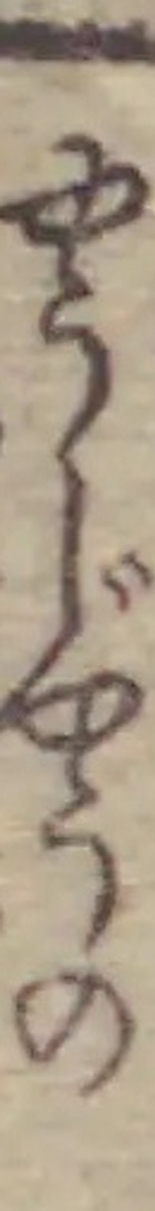やうじやうの
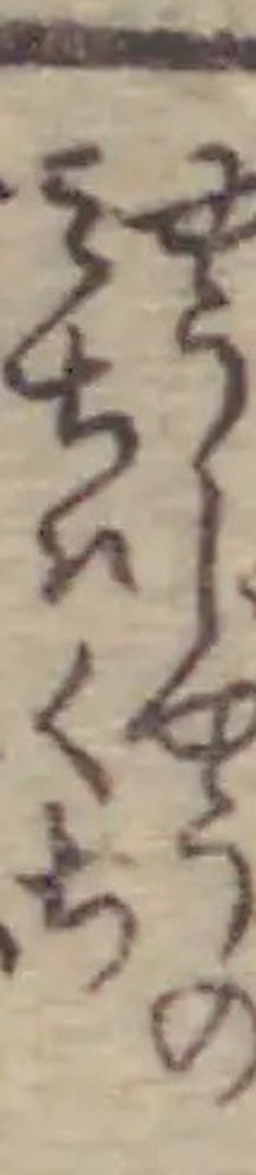みちはくち
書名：腹内養生主論 3巻
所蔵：国立国会図書館 National Diet Library, JAPAN
